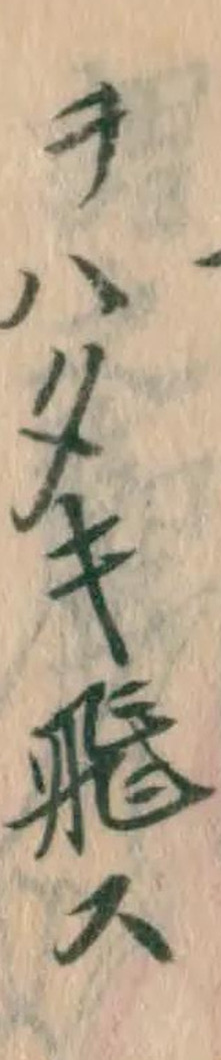ヲハタキ飛ス
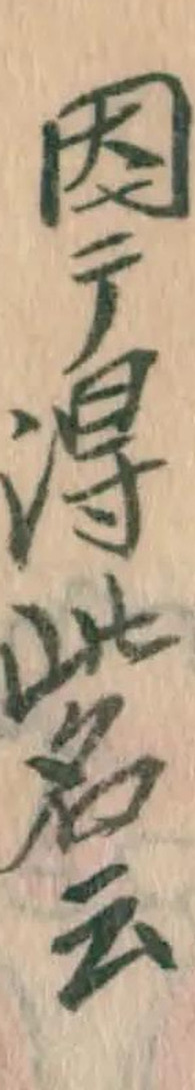因テ得此名云
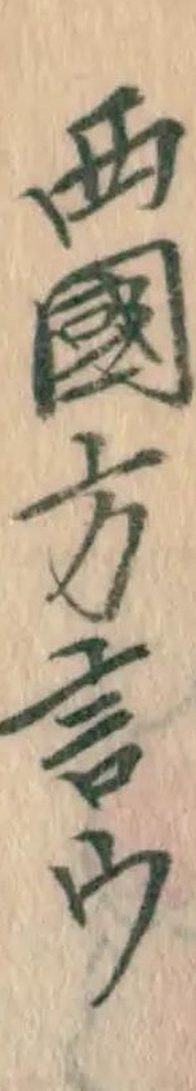西國方言ウ
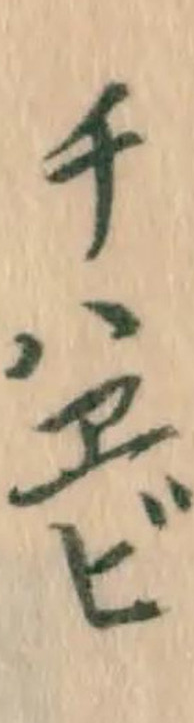チハヱビ

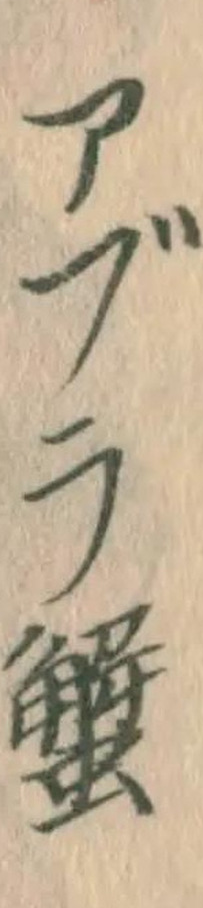アブラ蟹
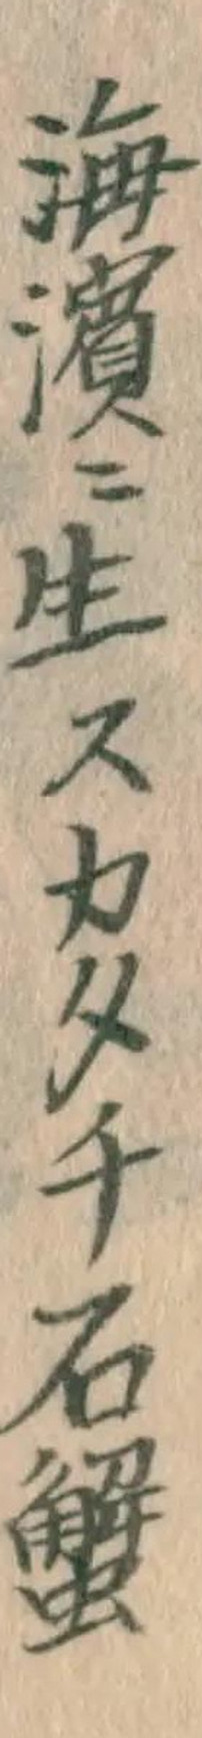海濱ニ生スカタチ石蟹
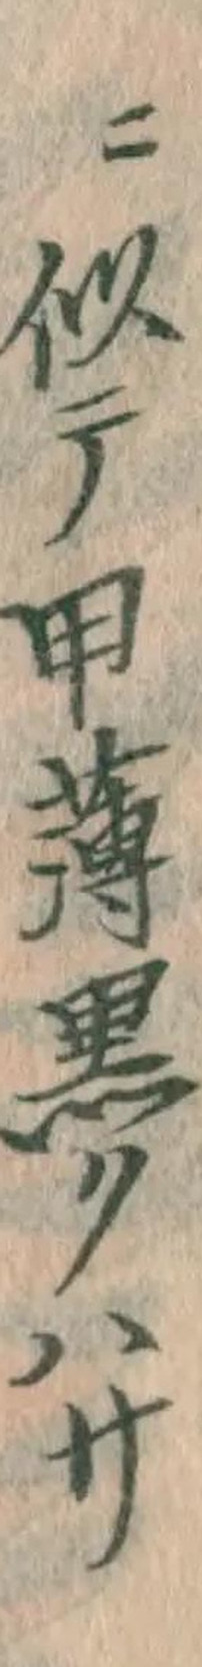ニ似テ甲薄黒クハサ
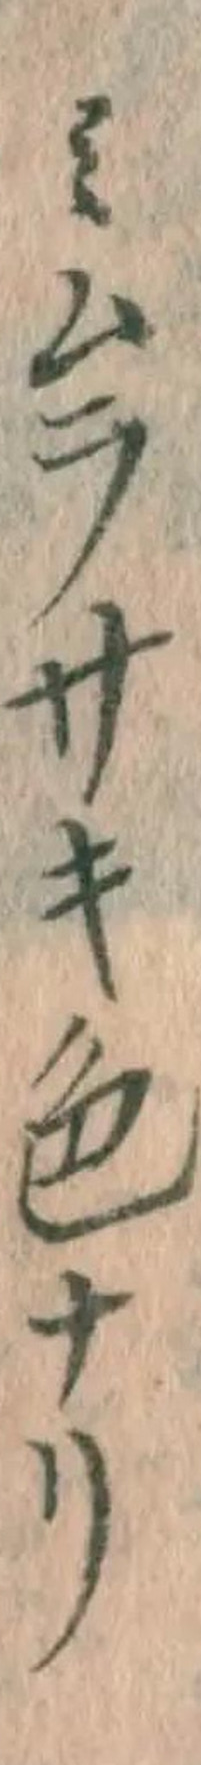ミムラサキ色ナリ
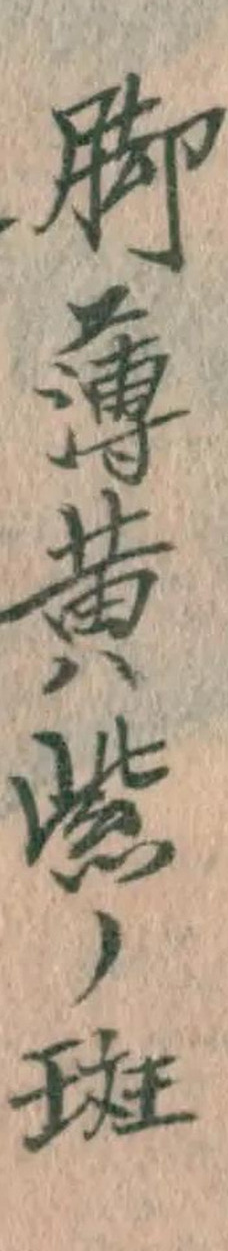脚薄黄紫ノ斑
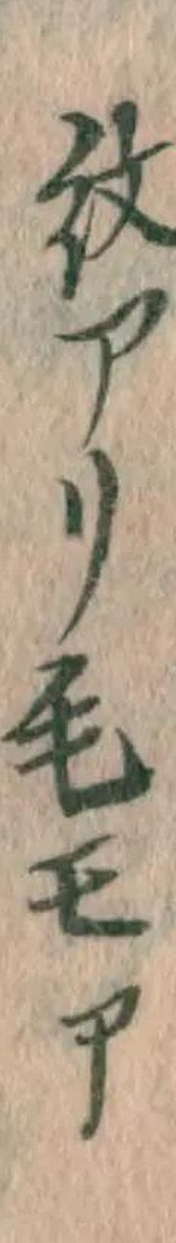紋アリ毛モア
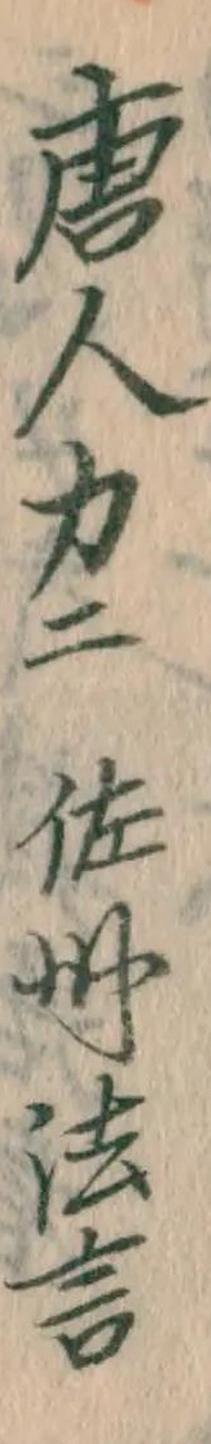唐人カニ佐州法言
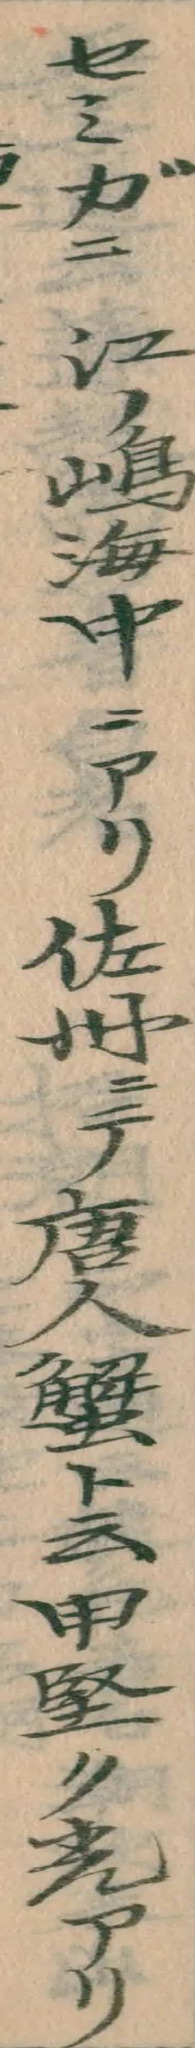セミガニ江ノ嶋海中ニアリ佐州ニテ唐人蟹ト云甲堅ク光アリ
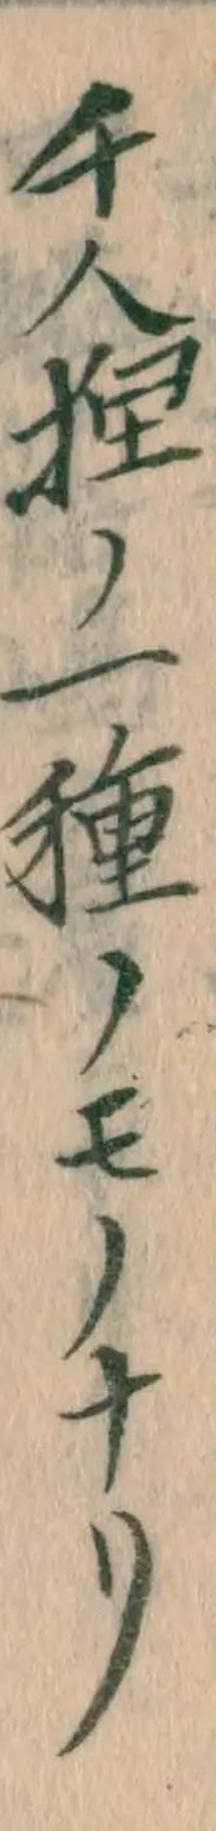千人捏ノ一種ノモノナリ
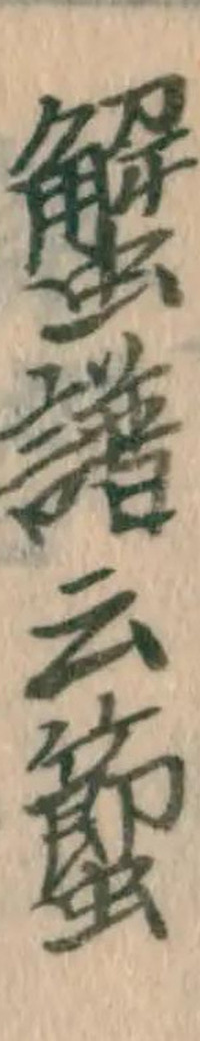蟹譜云蠞
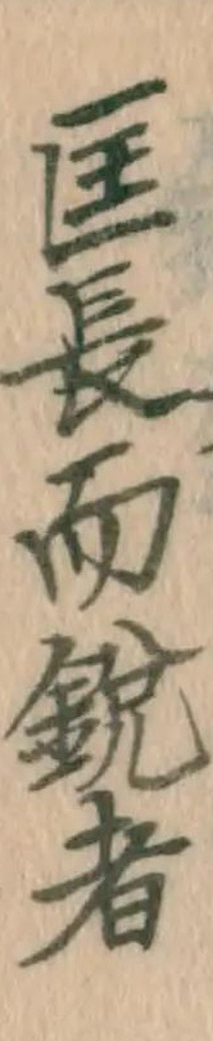匡長而鋭者
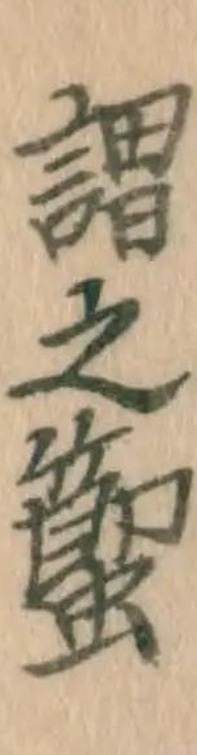謂之蠞
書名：千蟲譜 3巻. [2]
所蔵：国立国会図書館 National Diet Library, JAPAN
